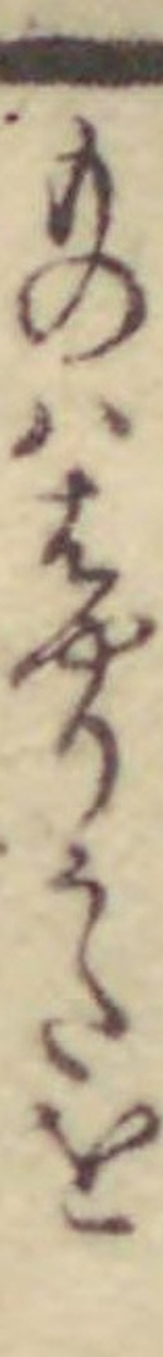ものははやりかたを
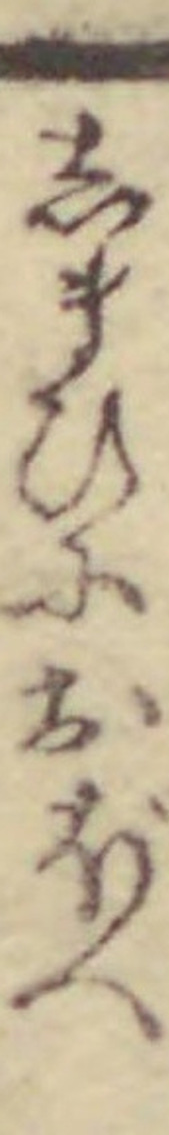しまひにおぼへ
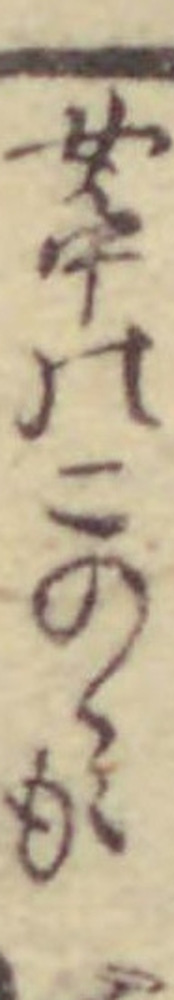女中のこのみも
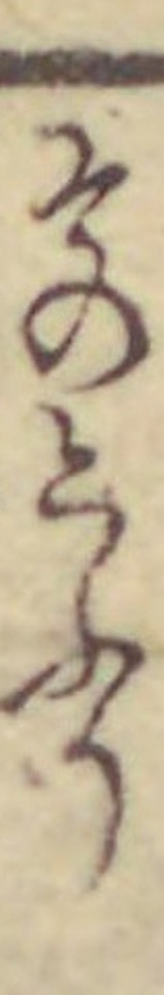そのとふり
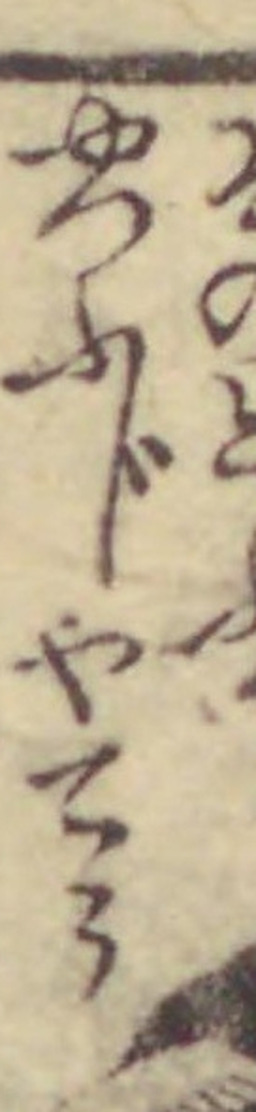やつふじやてう
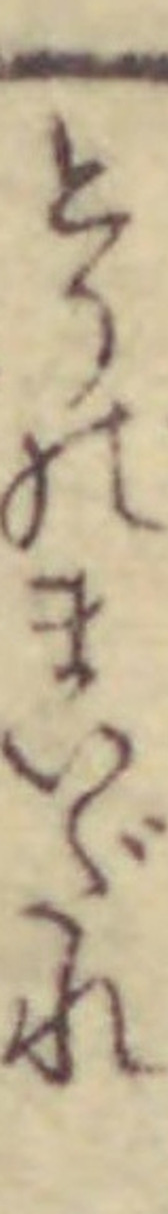とりのまいだれ
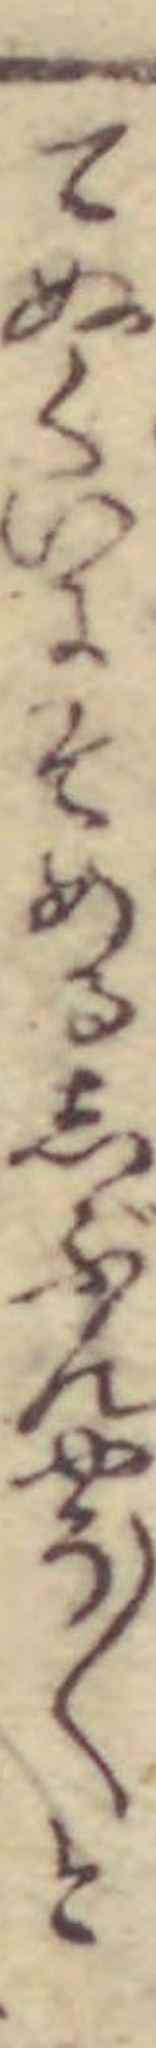てぬくいにそめるしぶんやう〳〵と
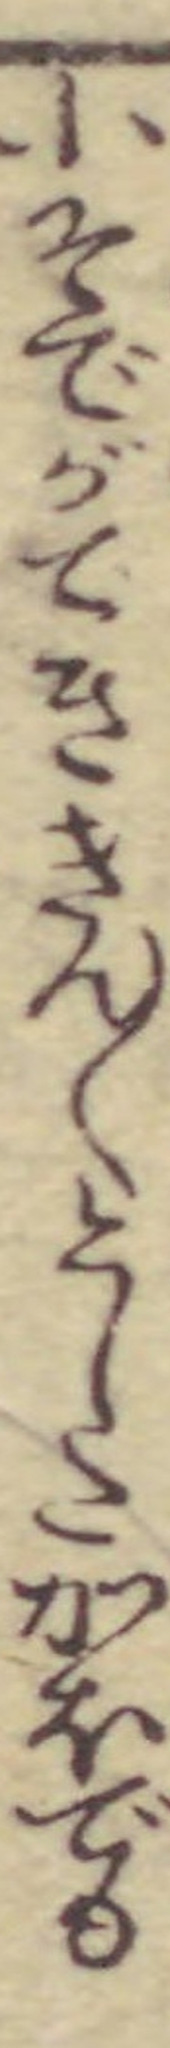小そでがてききん〳〵としたかほでも
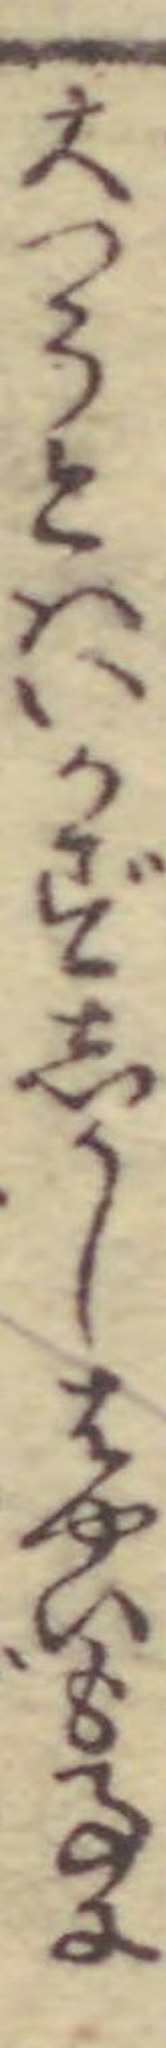大つうとはいかずしかしはやいも事に
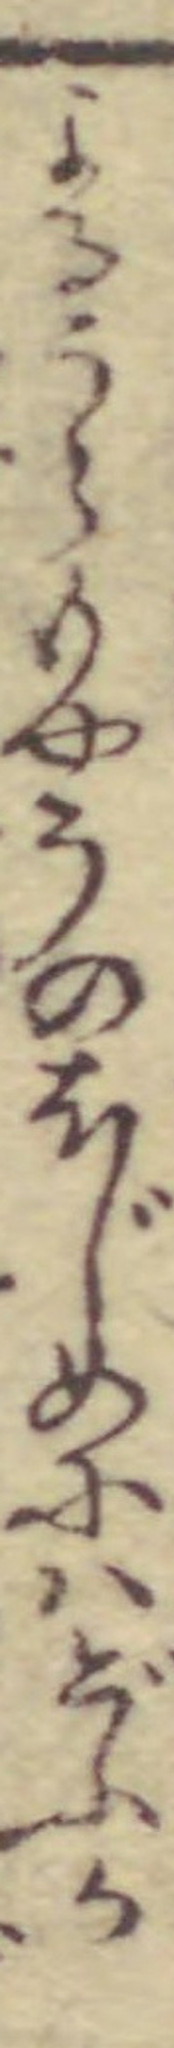よるうらもやうのほじめにはどふか
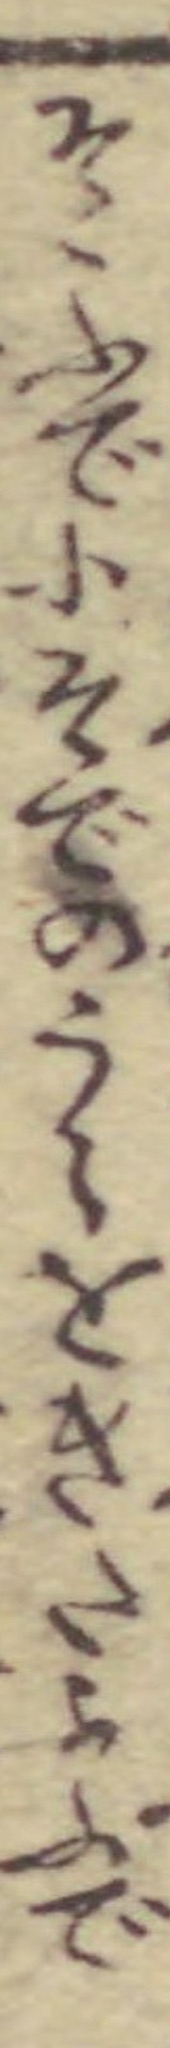そゝふで小そでのうらをきたよふで
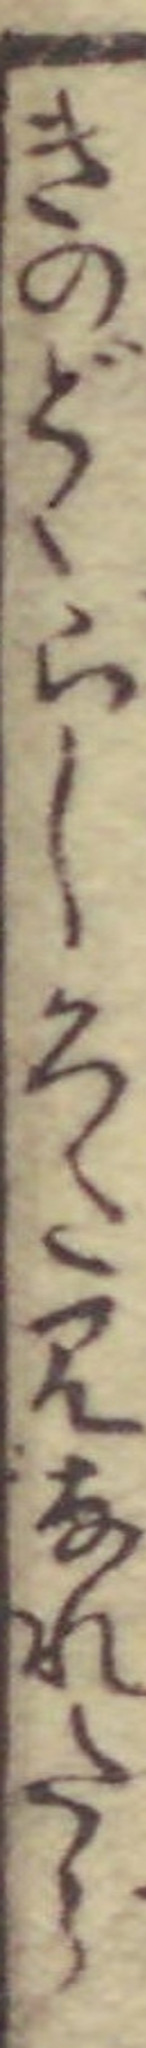きのどくらしかつた見なれたら
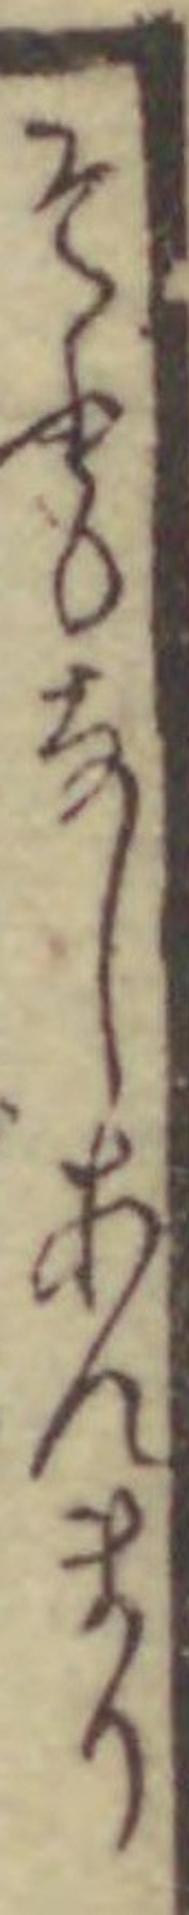そふもなしあんまり
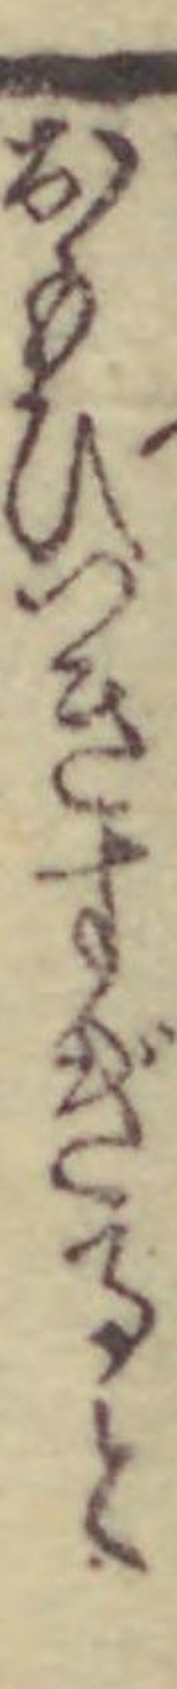おもひつきすぎると
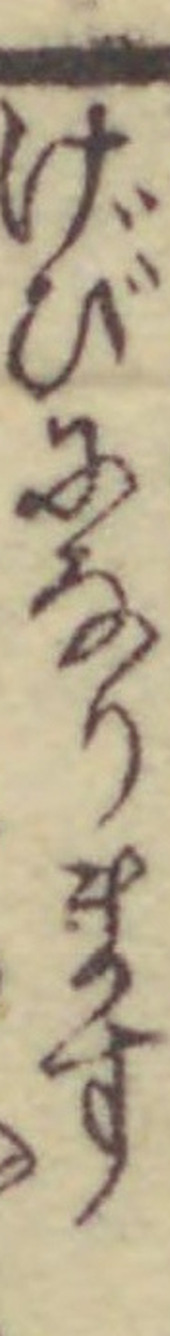げびになります
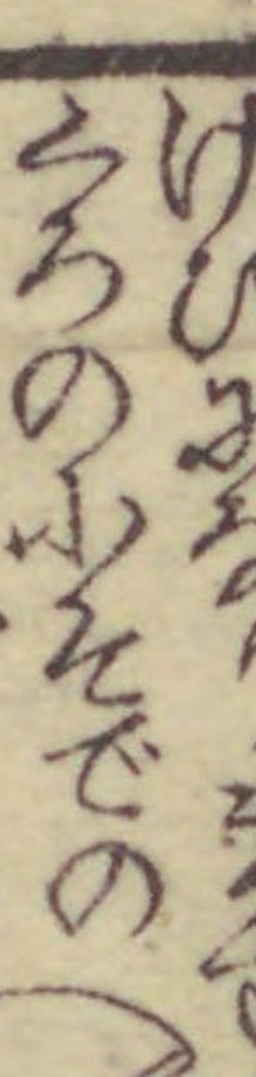くろの小そでの
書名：大通人穴[サガシ] 3巻
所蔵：国立国会図書館 National Diet Library, JAPAN
